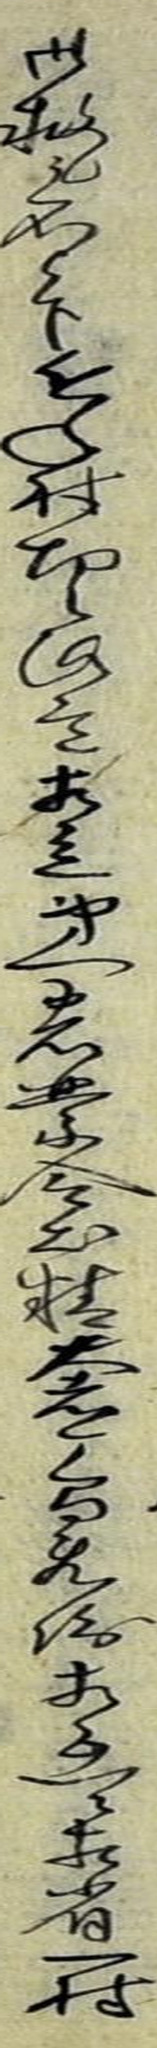御救も不被下近年村切之趣意相立第一農業令出精奢ケ間敷儀相互ニ相省一村
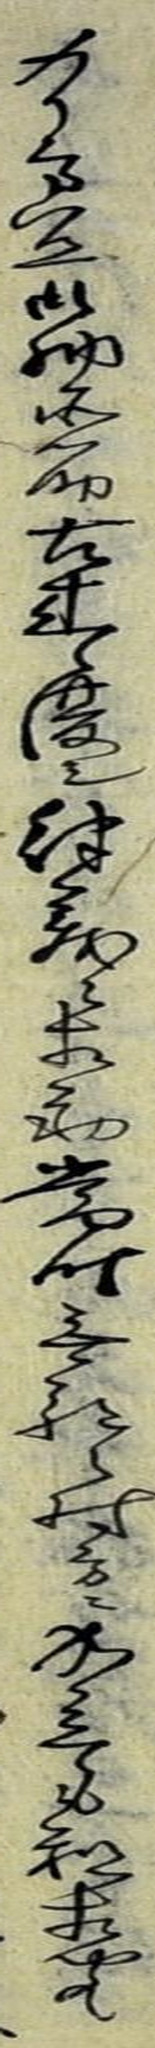〆り方宜御納所筋古来へ復シ律義ニ相勤常時無難之村方ニ成立も粗相聞候
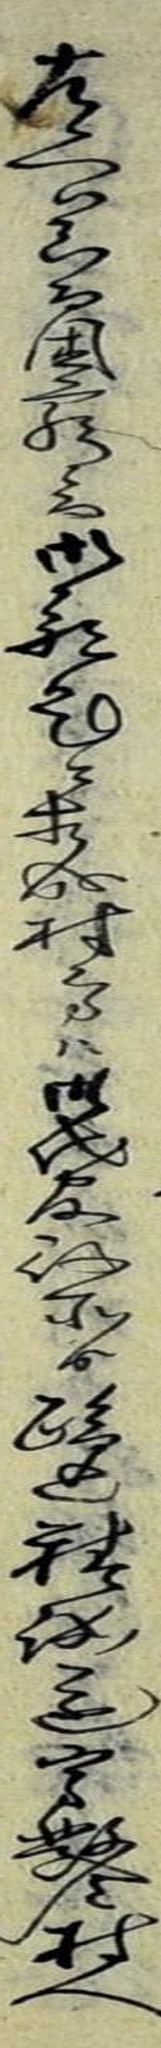左候ヘハ至而困窮ニ而御難題ニ相成村方ハ御代官役所ゟ込精誠遂穿鑿村人
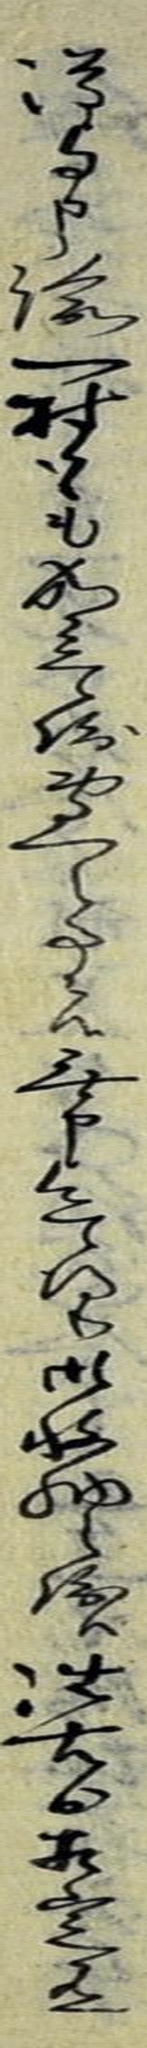得与申諭一村ツヽも成立候儀専一之事ニ候無申迄候得共御収納之儀ハ往古ゟ相定有
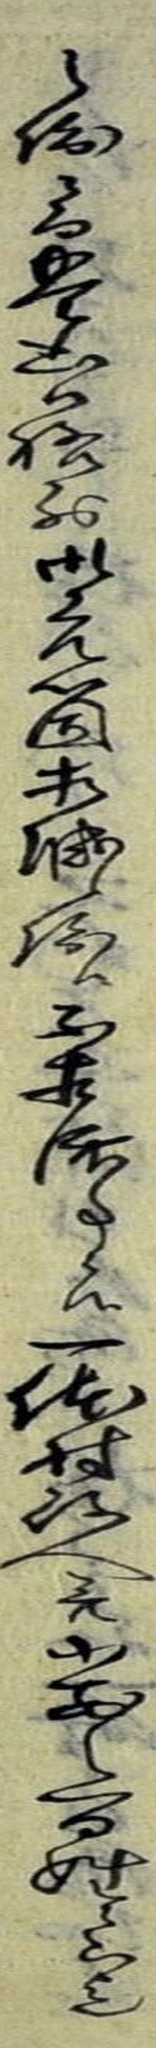之儀ニ而豊凶ハ格別御取箇相減候儀ハ不相済事ニ候一体村役人并小前之百姓ニ至迄
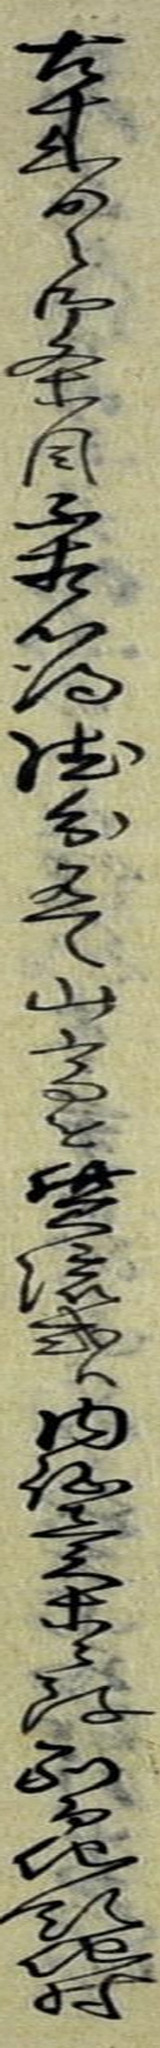古来ゟ之御条目不相心得徳分有之山高を質流或ハ内証売等ニ致別而他領他村
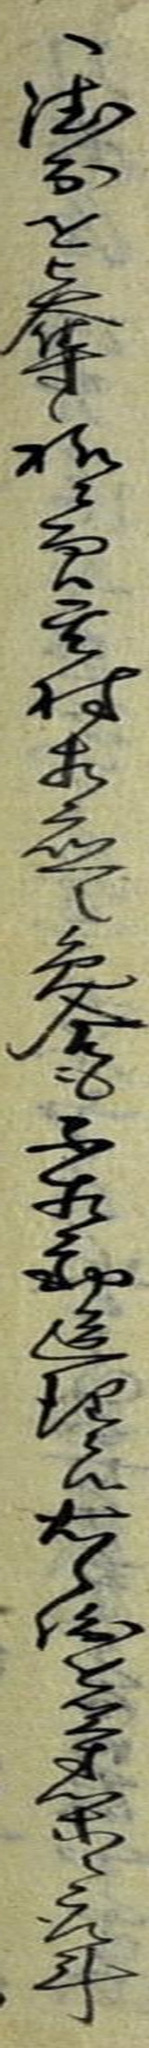へ徳分を被奪候様ニ而ハ其村相応之免合も不相勤道理ニ候右之儀を等閑ニ取計
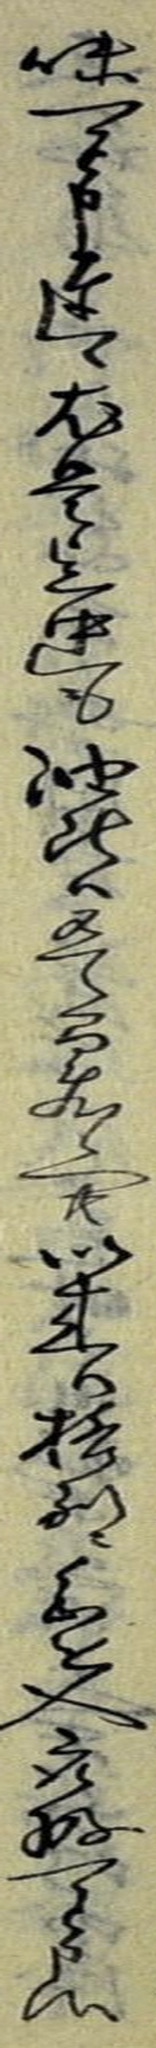味可被申達候尤是迄迚も油断ハ有之間敷候へ共以来ハ格別ニ念を入取扱可被申候
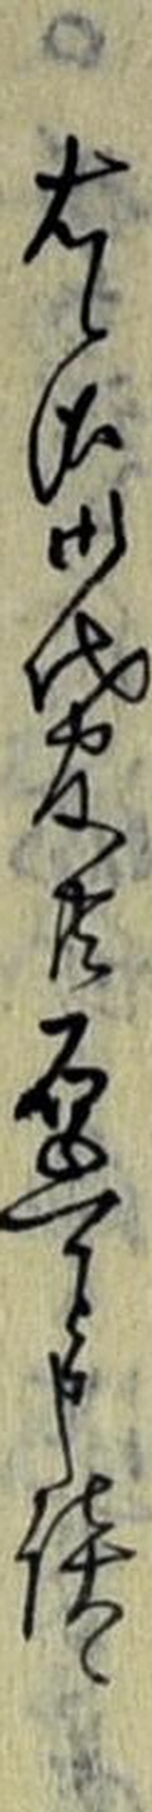右之趣御代官共厚可被申談候
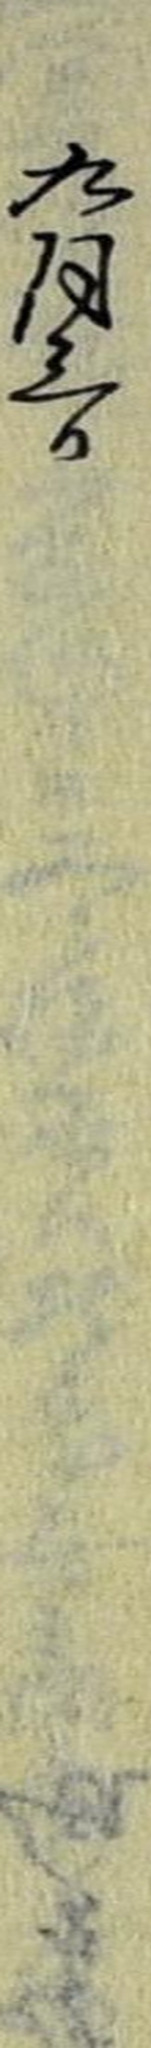九月三日
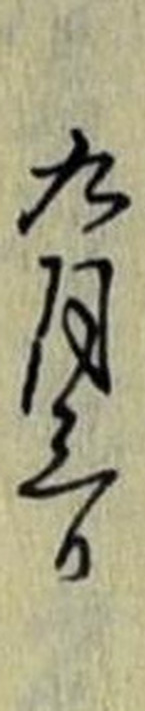九月三日
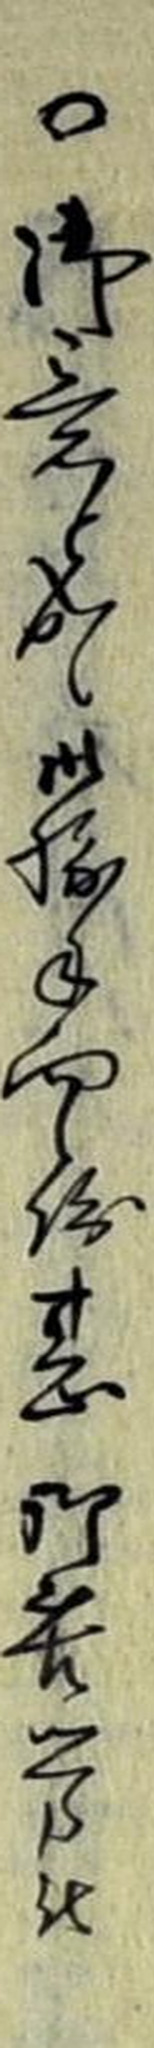〇御意被成候御勝手向之儀甚御苦労被
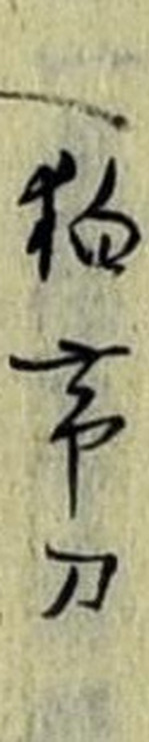狛帯刀
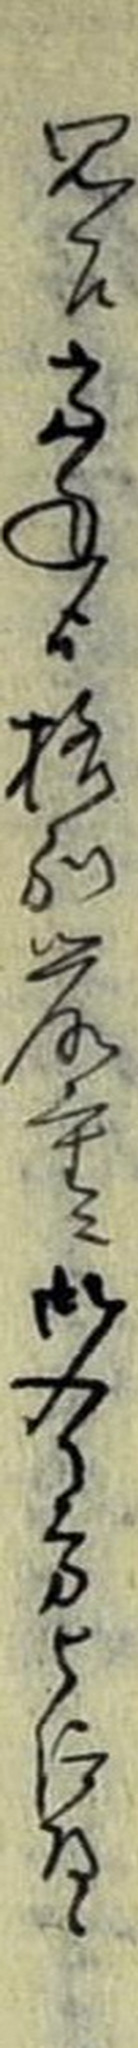思召当年ゟ格別厳重ニ御〆り方被仰付候
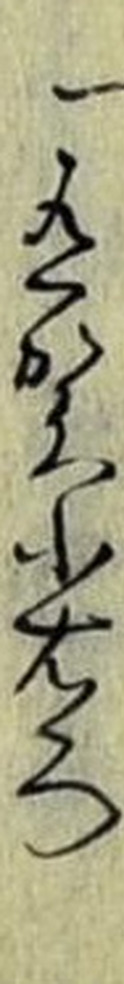有賀小右衛門
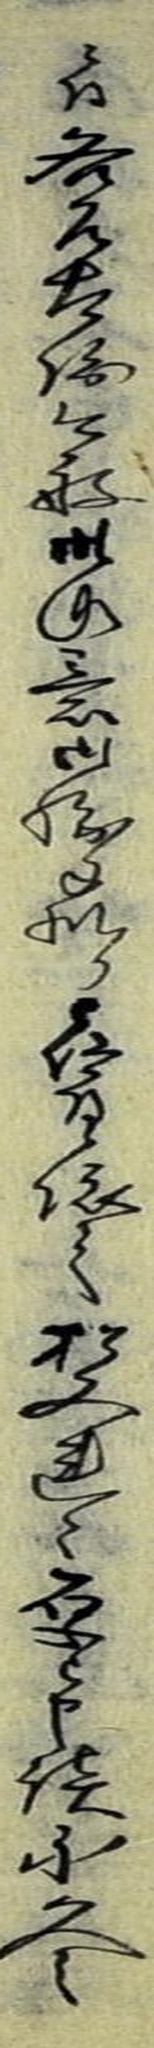ニ付各乍太儀今般御趣意御勝手掛り被仰付候依之猶又連々厚被申談永久之
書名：命令之部 三
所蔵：福井県文書館 Fukui Prefectural Archives
